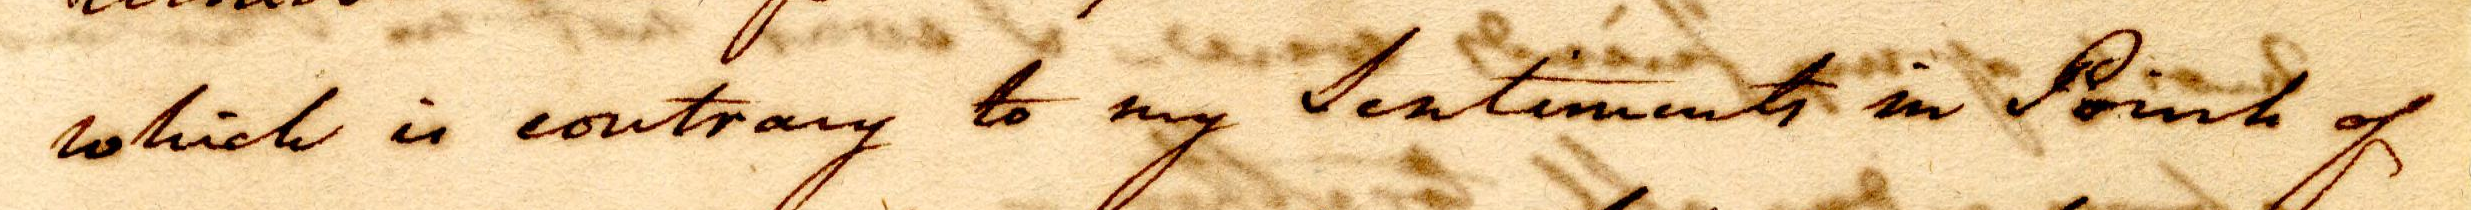which is contrary to my Sentiments in Point of
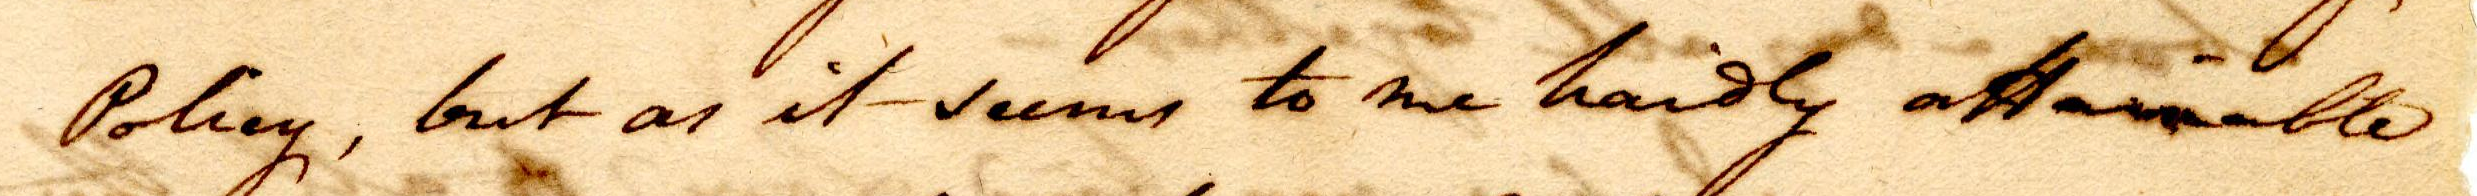Policy, but as it seems to me hardly assailable
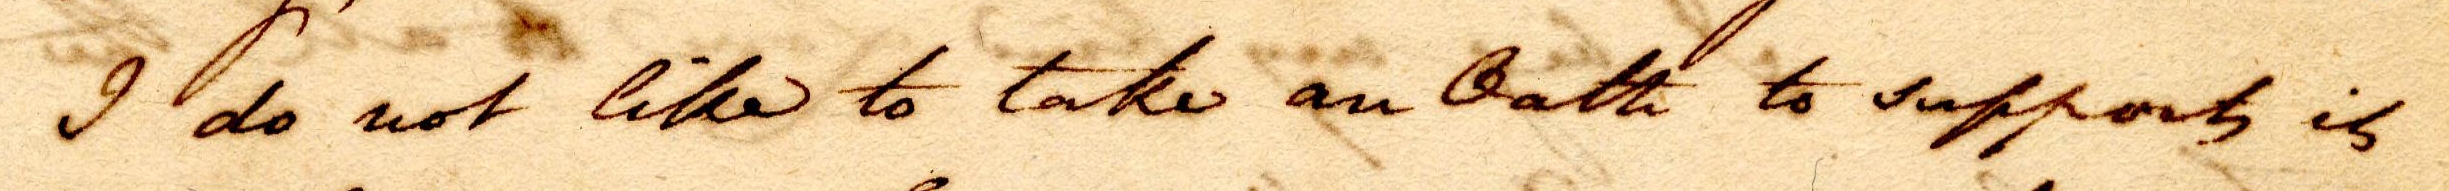I do not like to take an Oath to support it
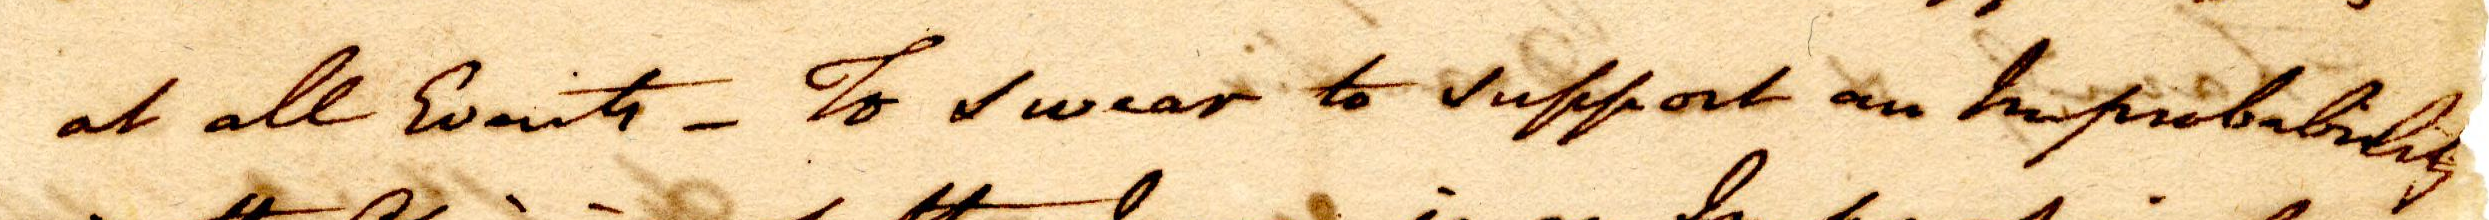at all Events. To swear to support an Improbability
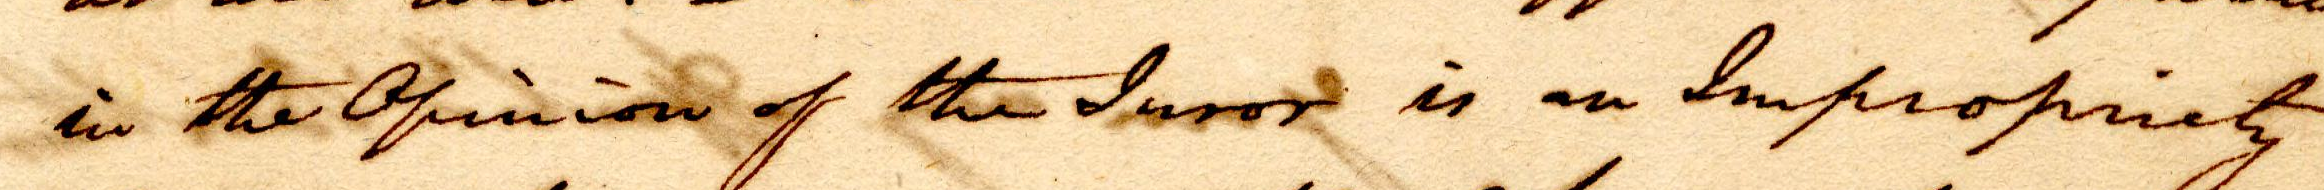in the Opinion of the Juror is an Impropiety.
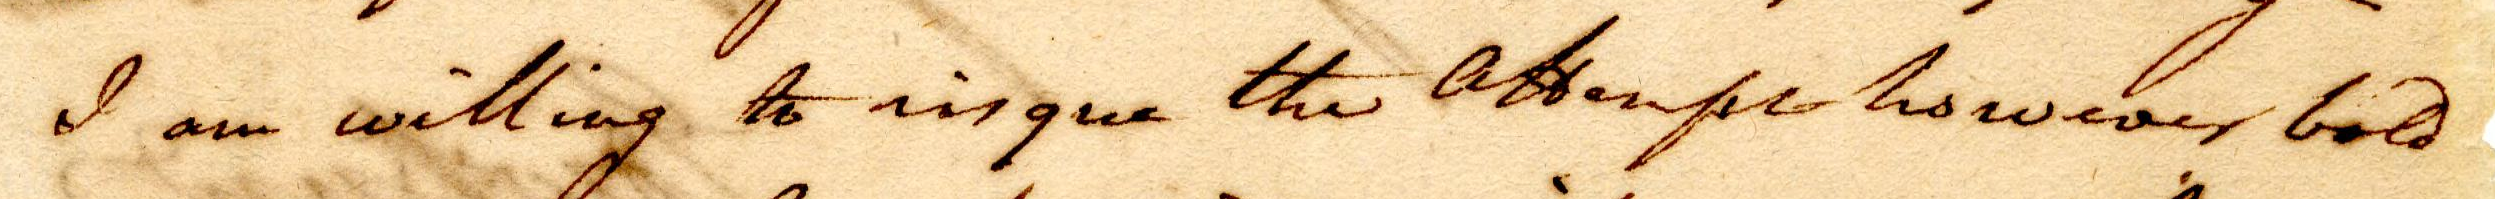I am willing to risque the attempt however bold
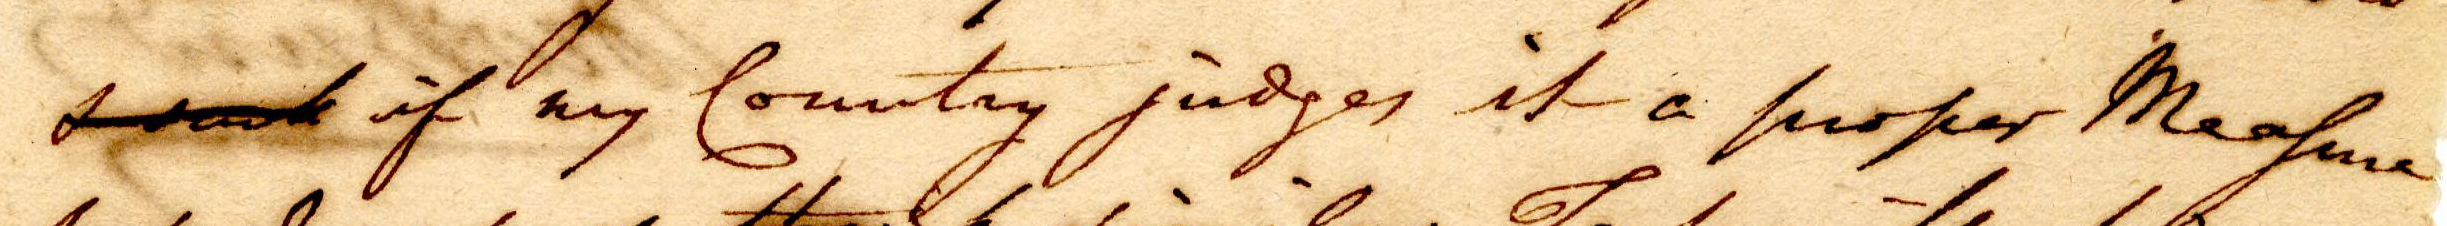& such if my Country judges it a proper Measure
